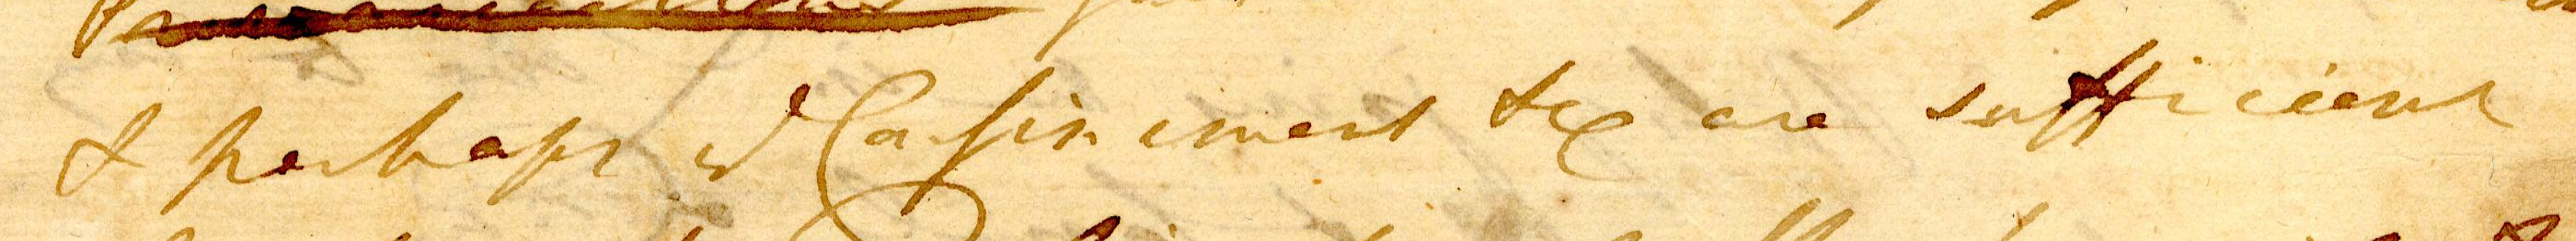& perhaps y^e Confinement &c are sufficient
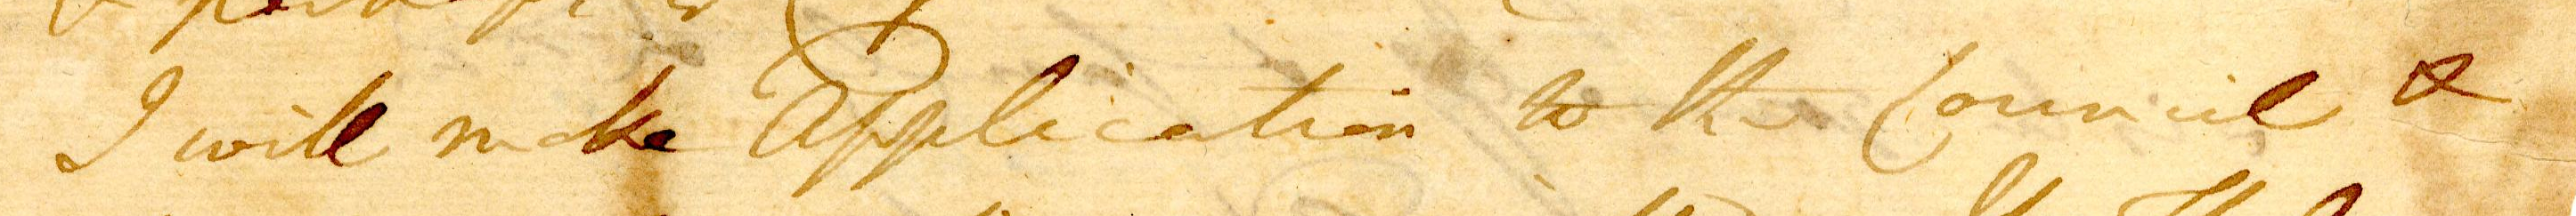I will make Application to the Council &
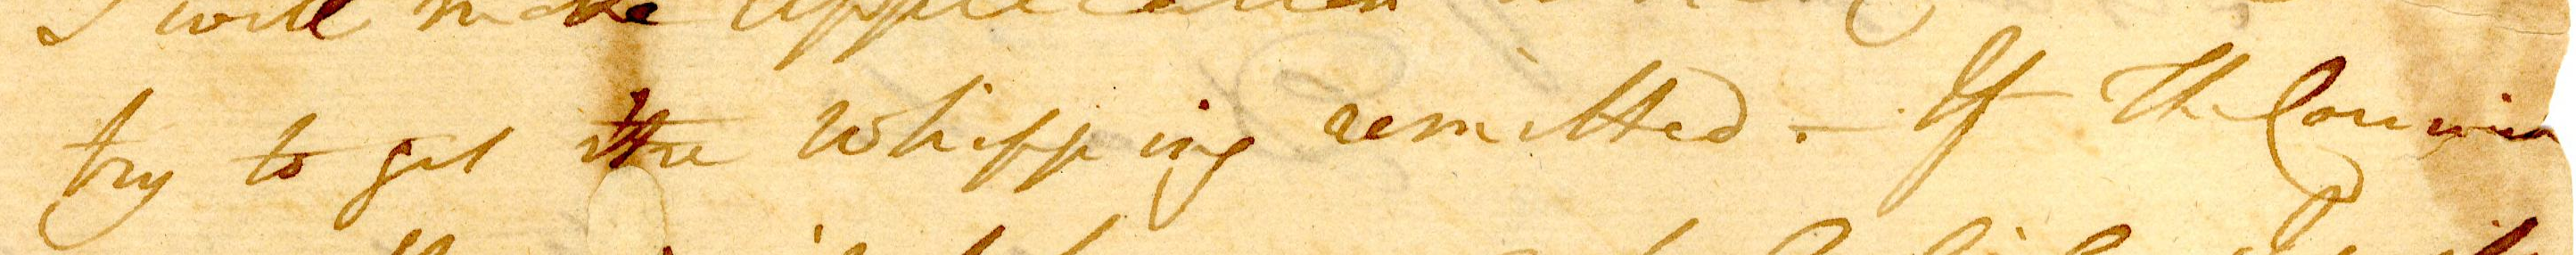ty to get the whipping remitted. If the Courier
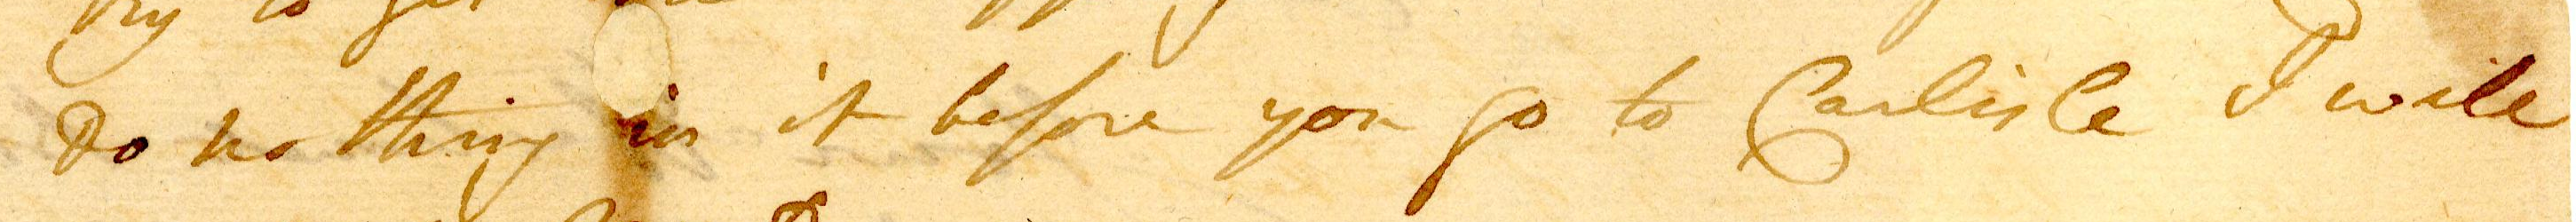do no thing in it before you go to Carlisle I will
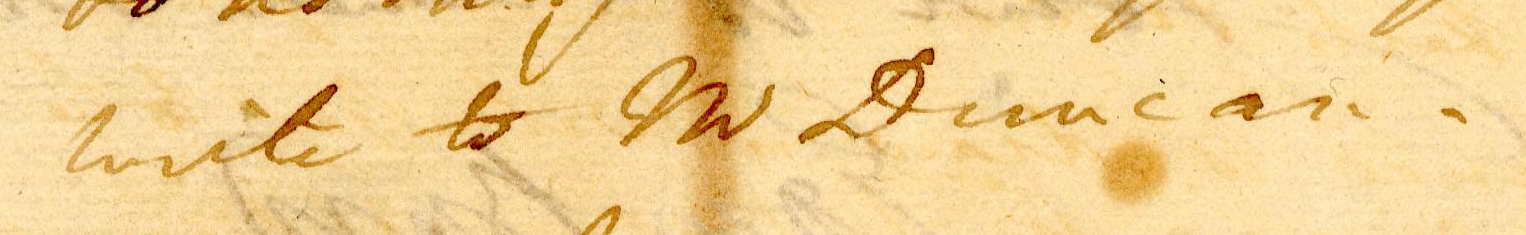write to M^r Duncan.
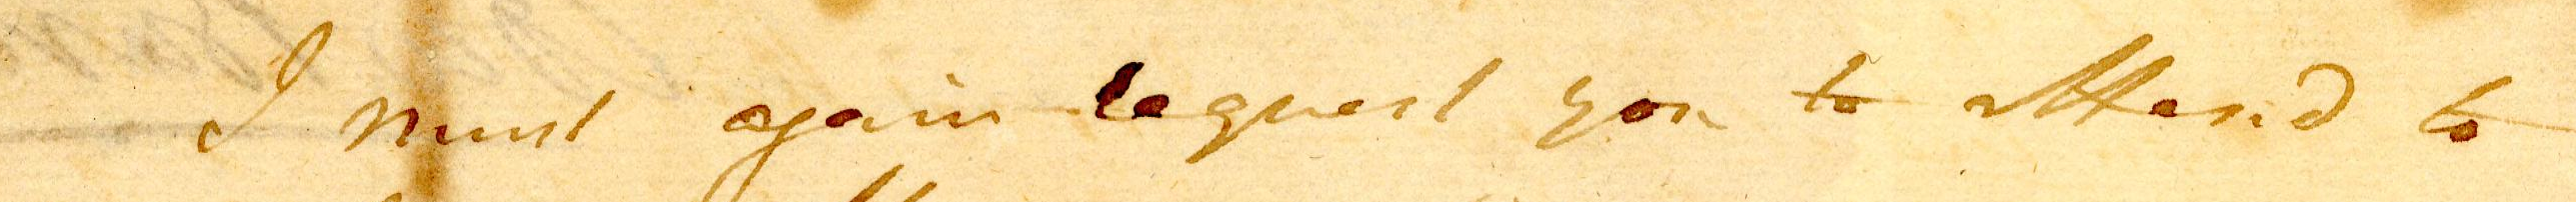I must again request you to attend to
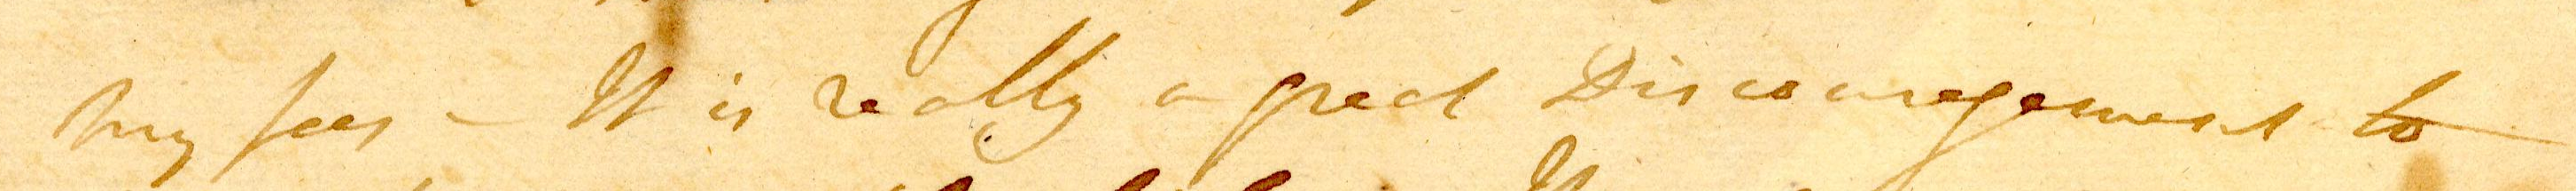my fees. It is really a great Discouragement to
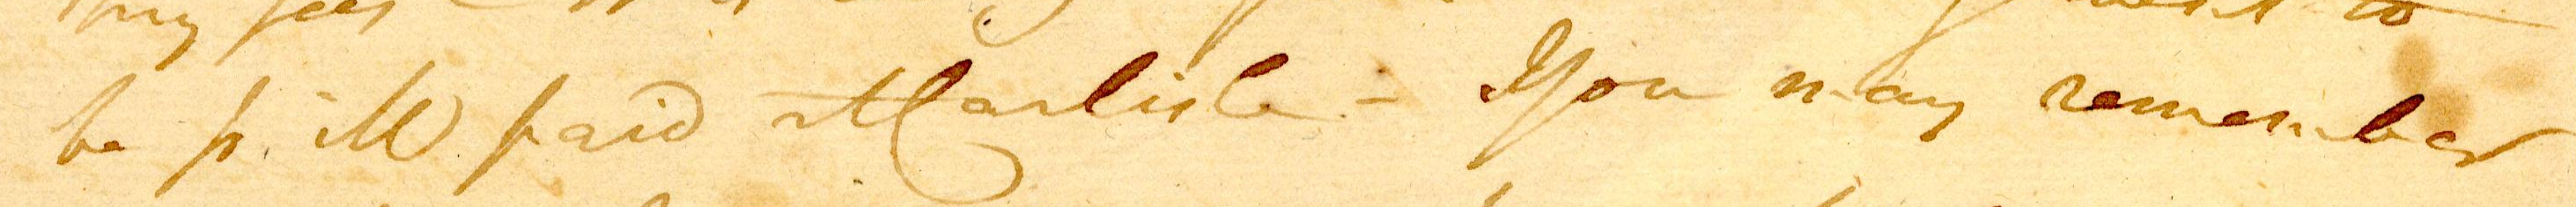be so ill paid at Carlisle. You may remember
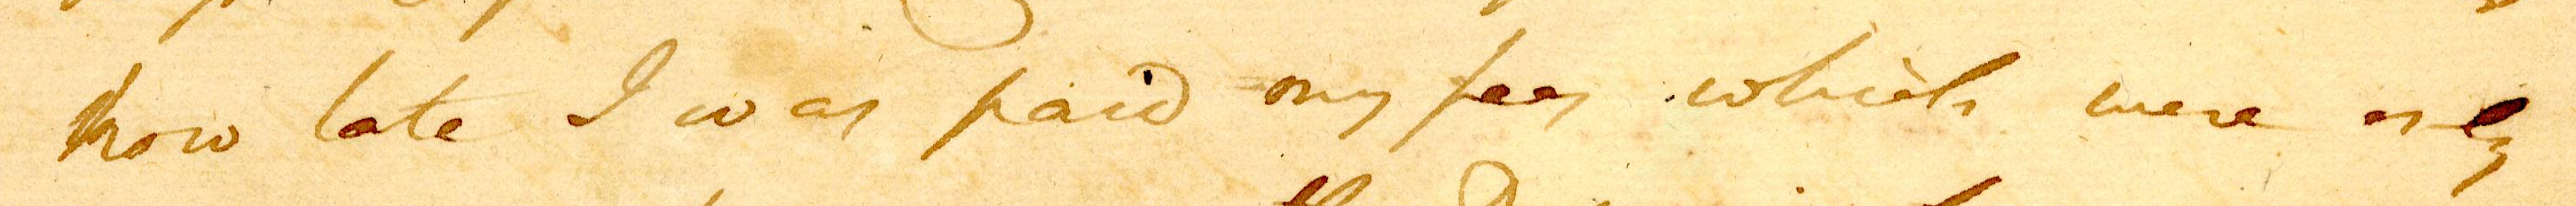how late I was paid my fees which were only
